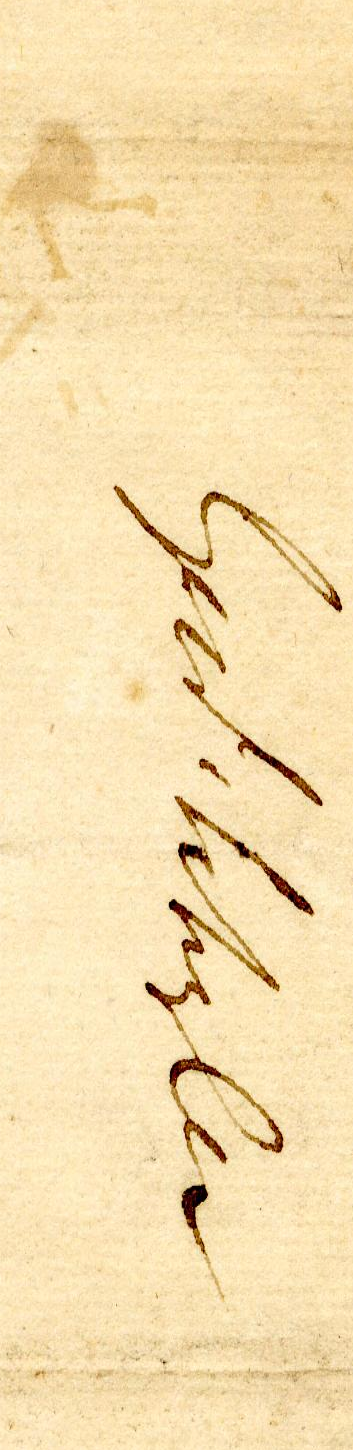Gen^l. schyler
